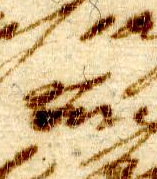Fire
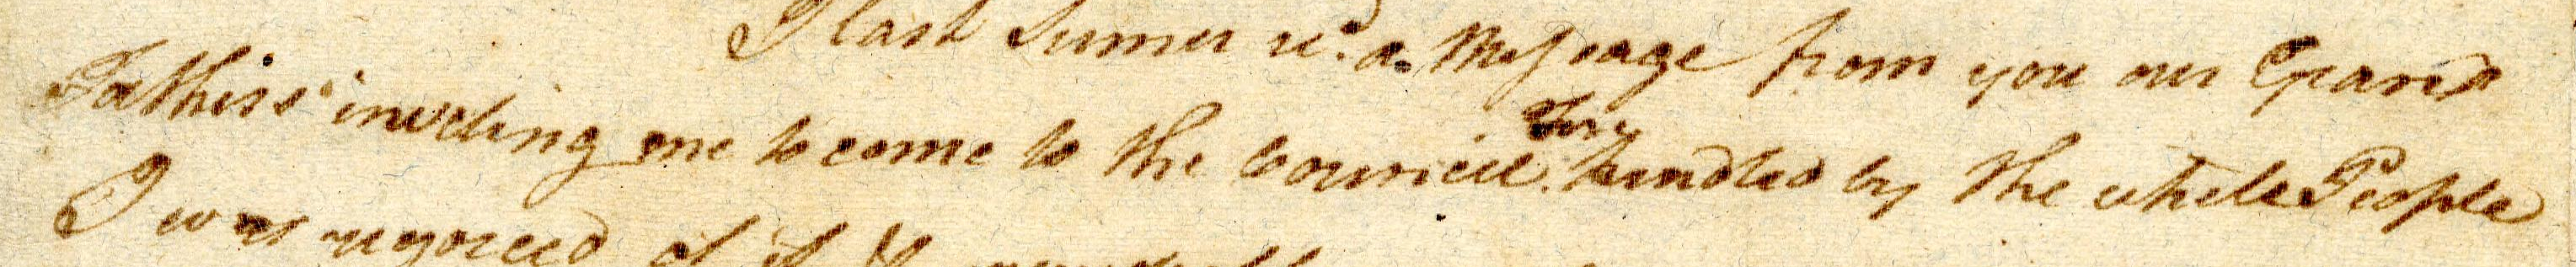Fathers inviting me to come to the Council^ kindled by the white People
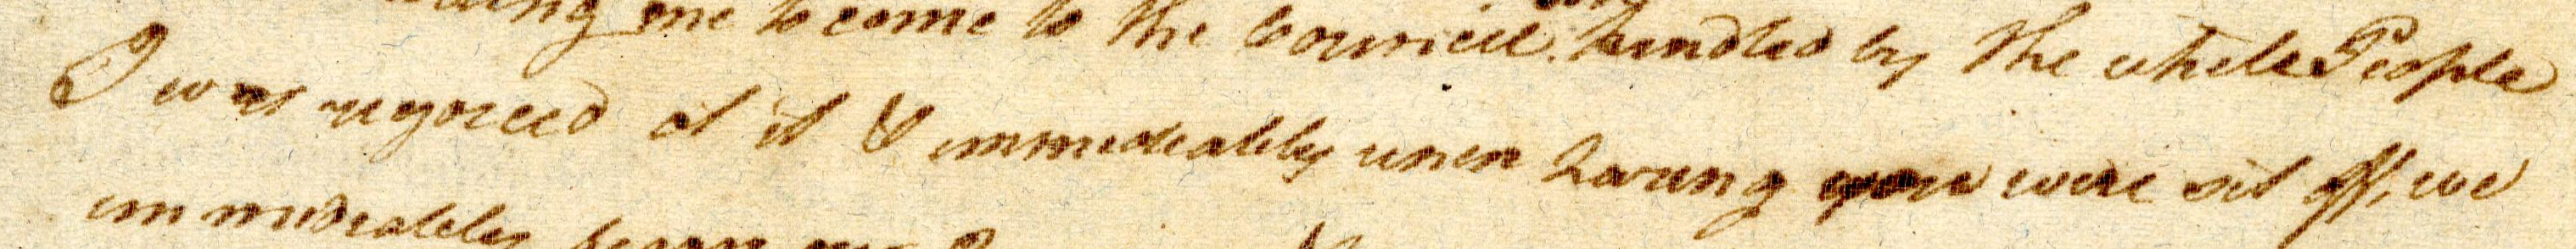I was rejoiced at it & immedeately upon hearing you were sit off, we
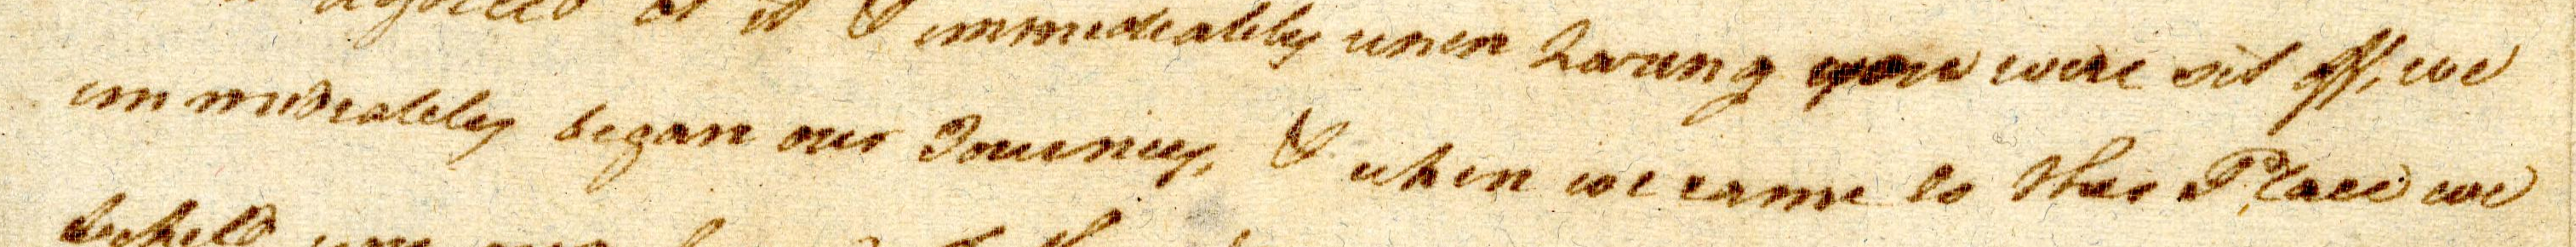immediately began our Journey, & when we came to this Place we
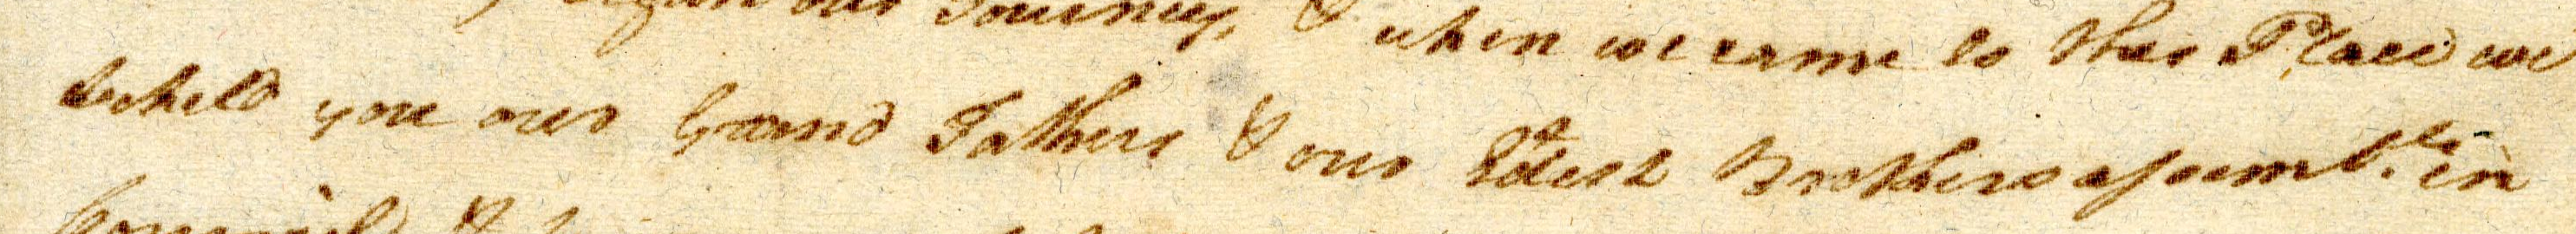beheld you our Grand Fathers & our Eldest Brothers assemb^le in
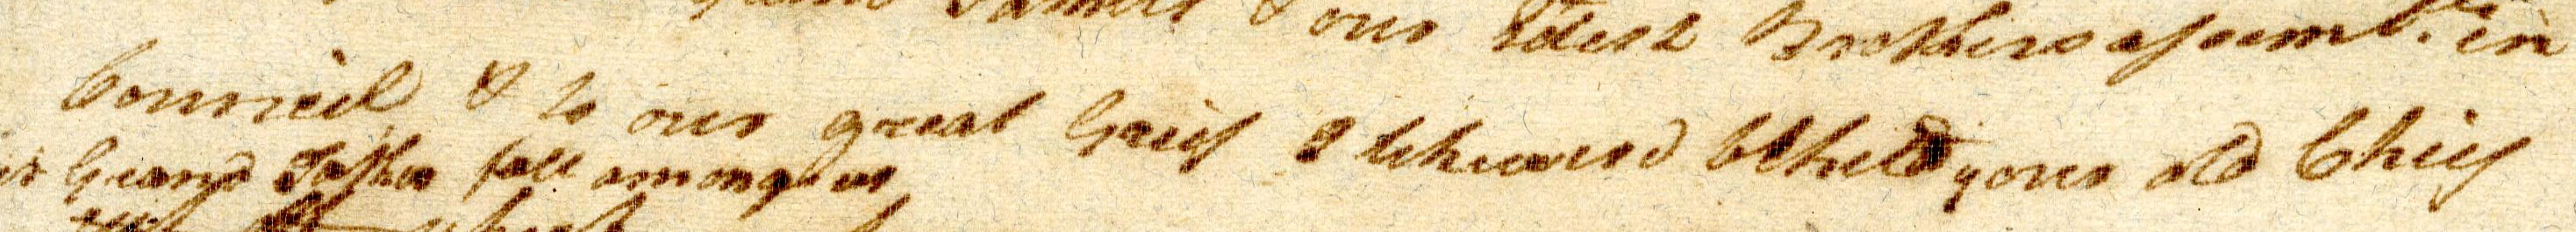Council & to our great Grief I [____]ed beheld your old Chief
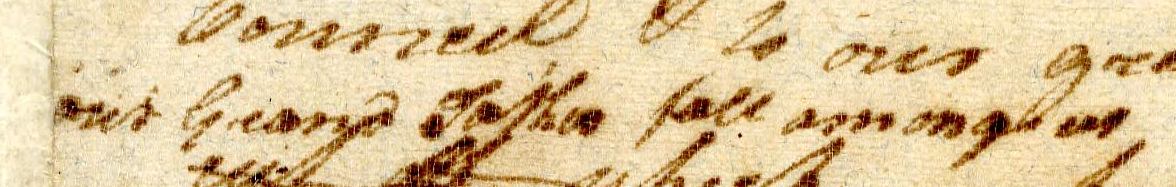our Grand Father fall among us
